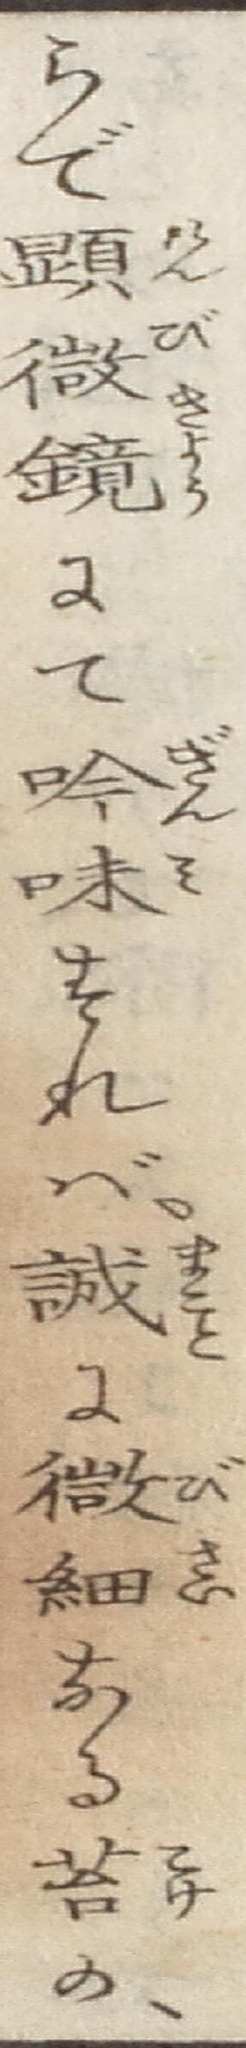らで顕微鏡にて吟味すれば。誠に微細なる苔の、
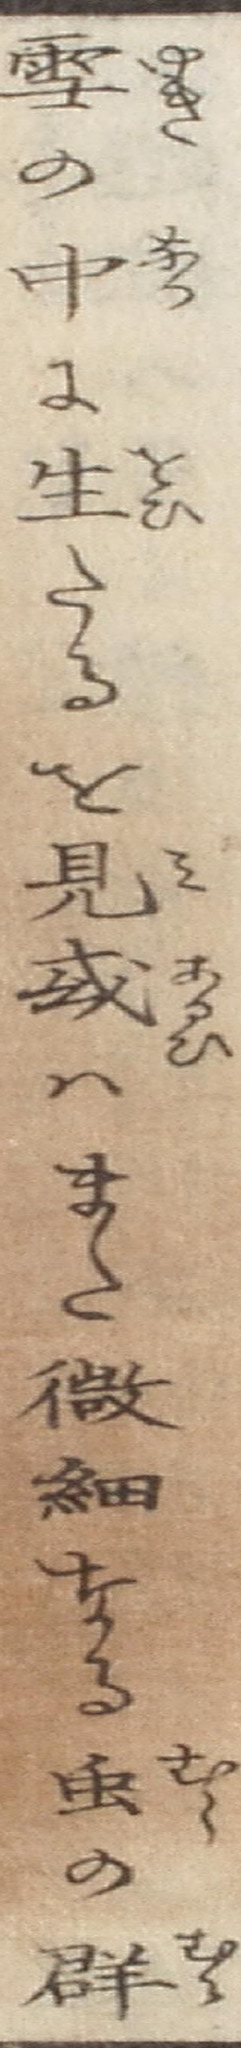雪の中に生たるを見或はまた微細なる虫の群
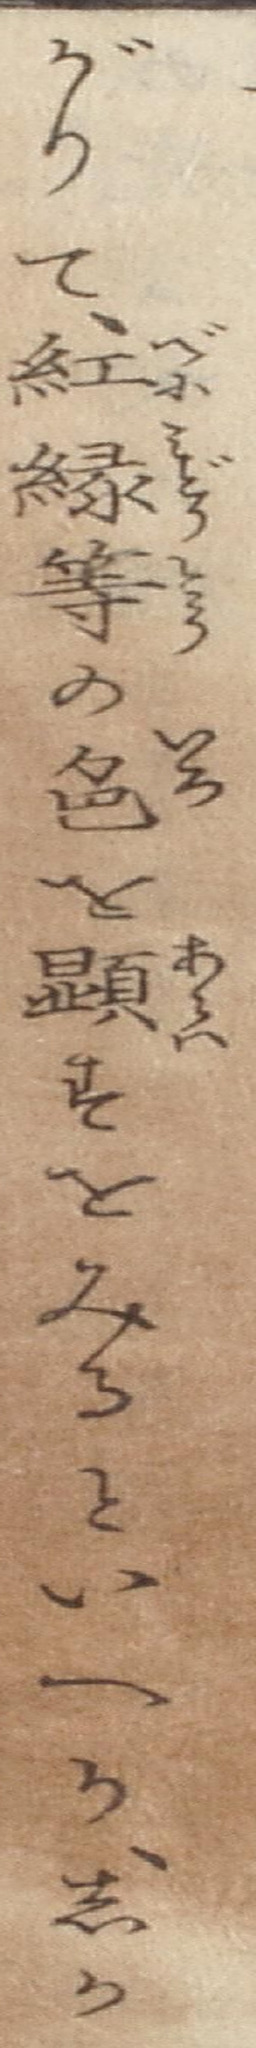がりて、紅緑等の色を顕すをみるといへり、しか
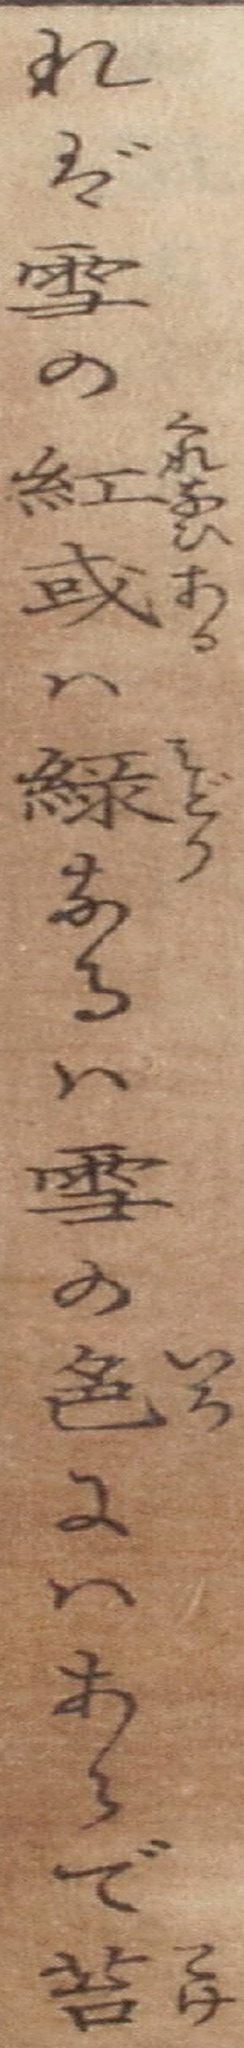れば雪の紅或は緑なるは雪の色にはあらで苔
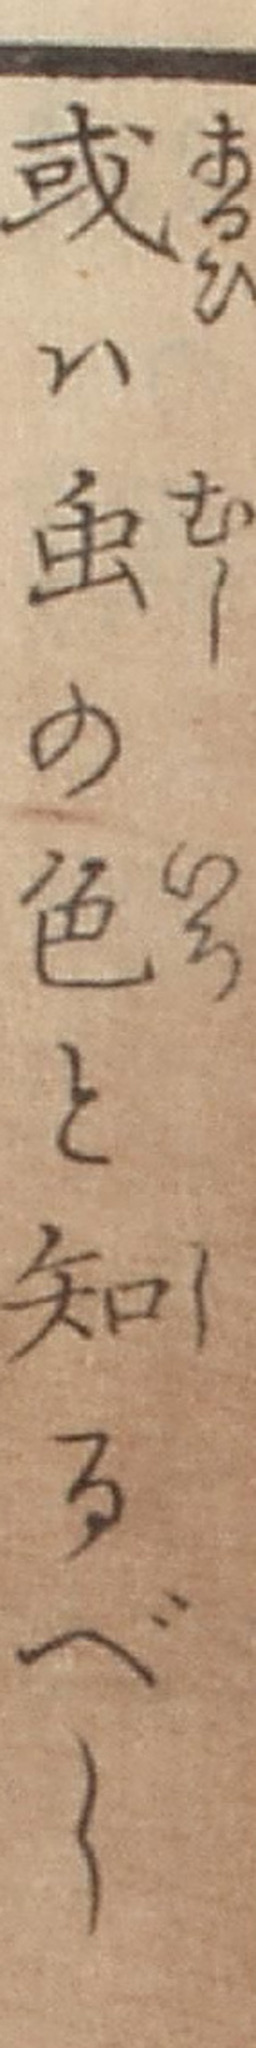或は虫の色と知るべし
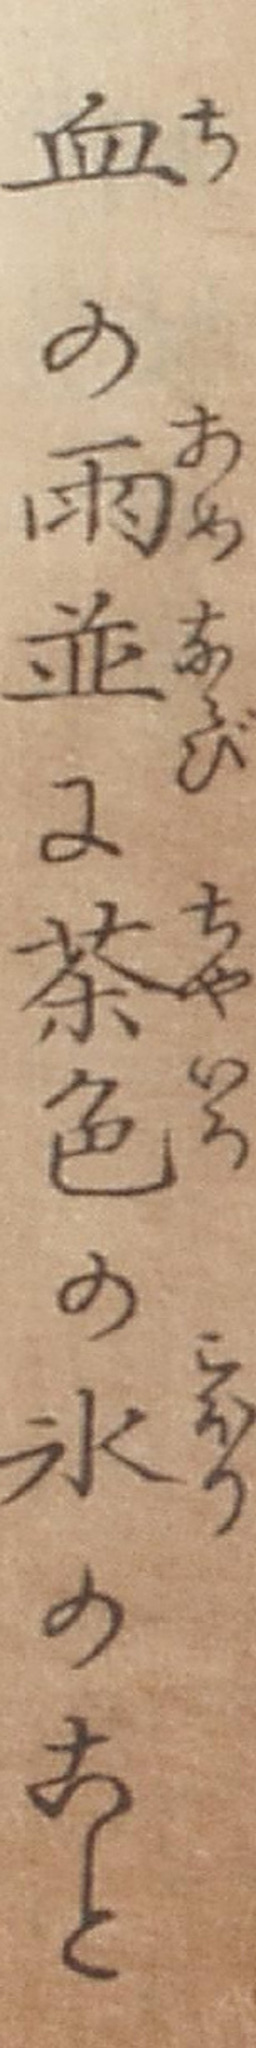血の雨並に茶色の氷のこと
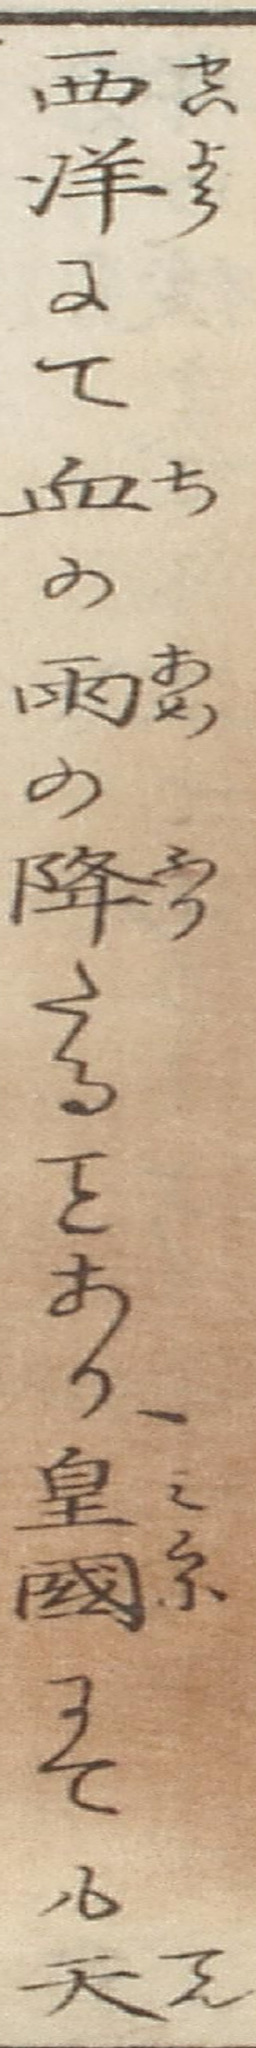西洋にて血の雨の降たることあり、皇国にても天
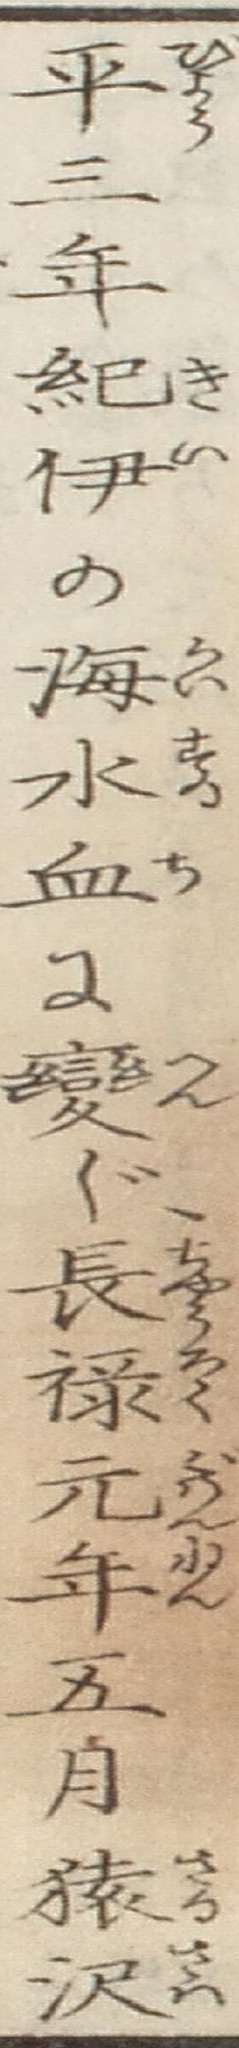平三年紀伊の海水血に変じ、長禄元年五月猿沢
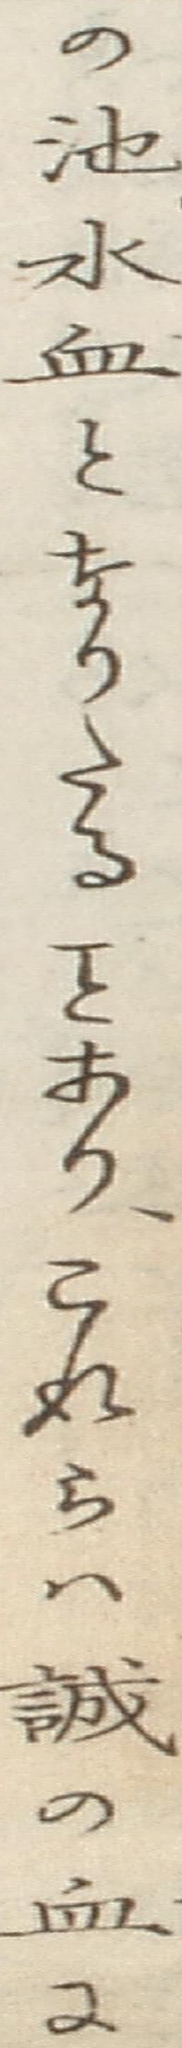の池水血となりたることあり、これらは誠の血に
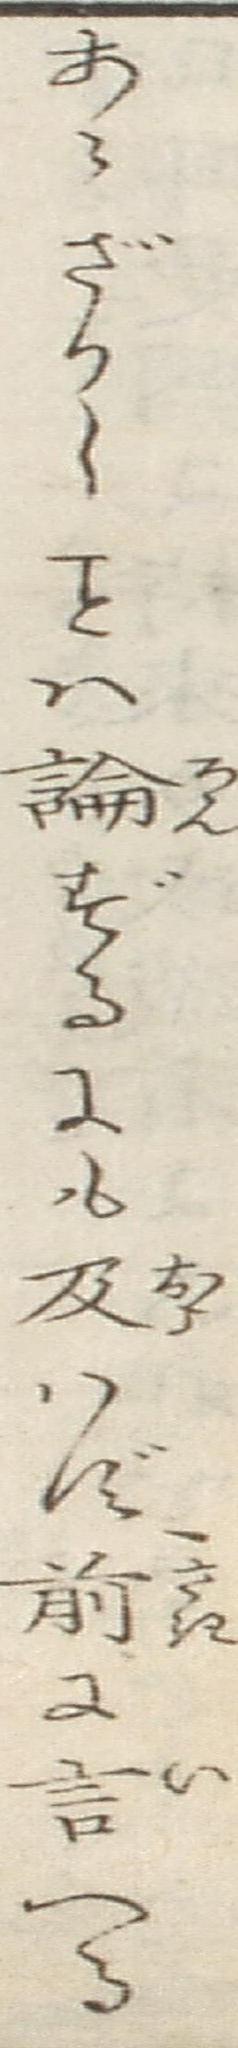あらざりしことは論ずるにも及はず、前に言へる
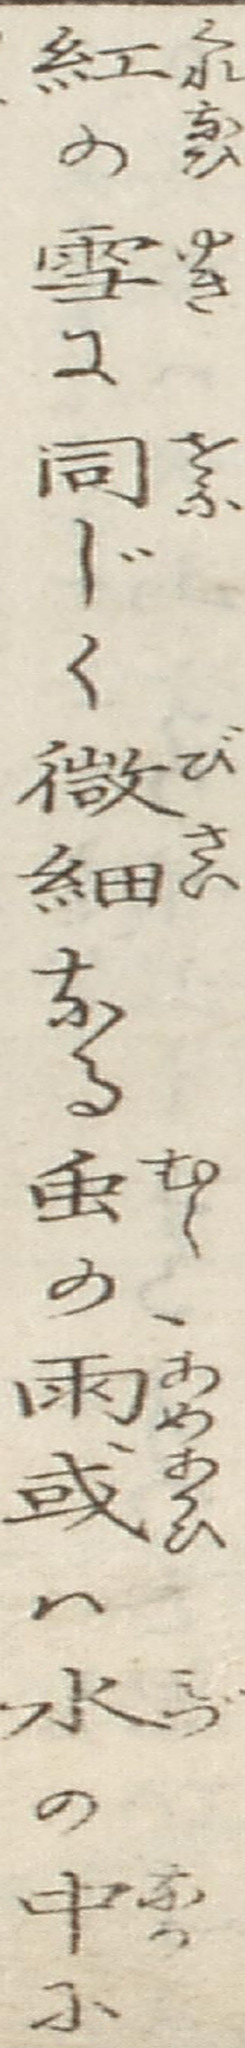紅の雪に同じく微細なる虫の、雨或は水の中に
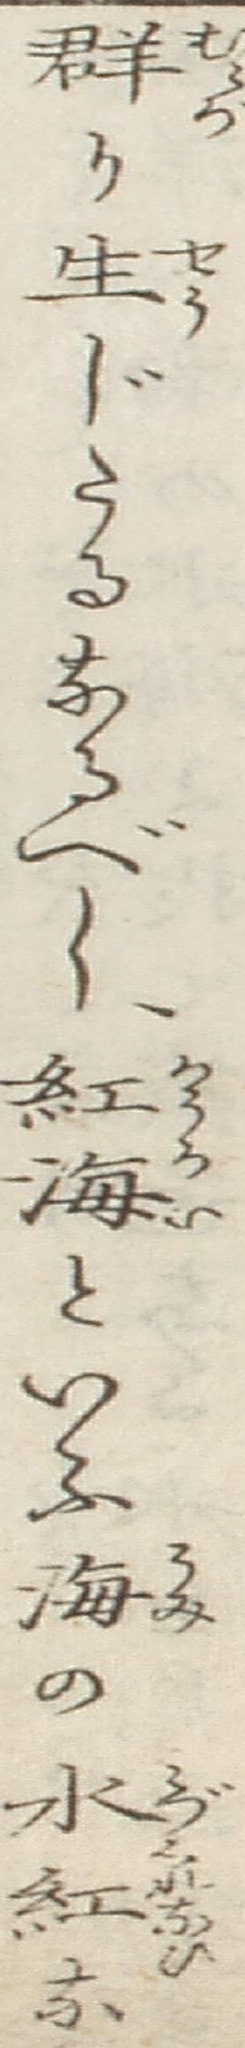群り生じたるなるべし、紅海といふ海の水紅な
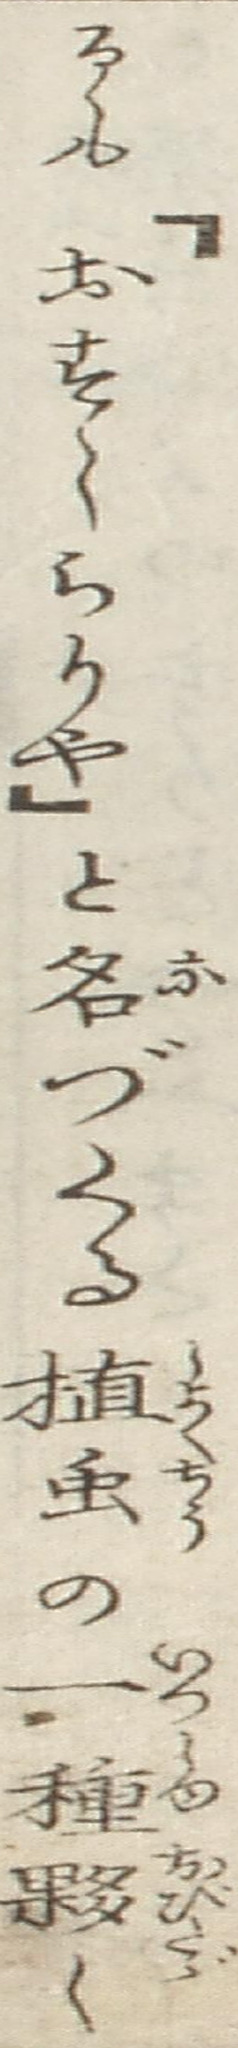るも「おすしらりや」と名づくる植虫の一種夥し

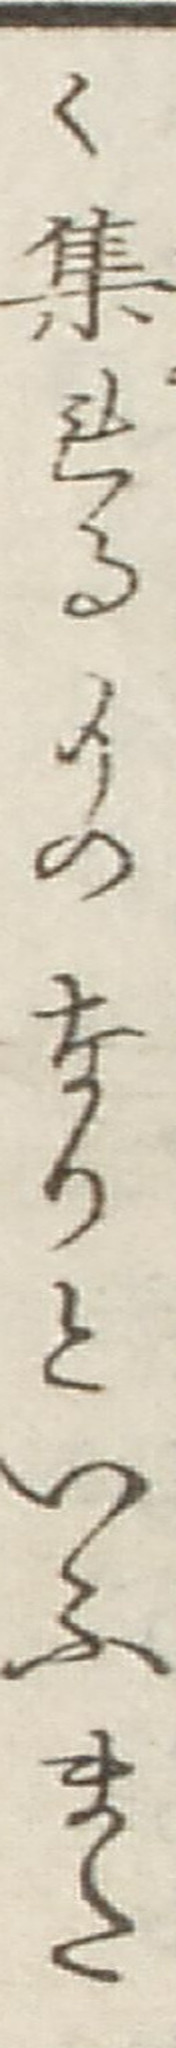く集れるものなりといふまた
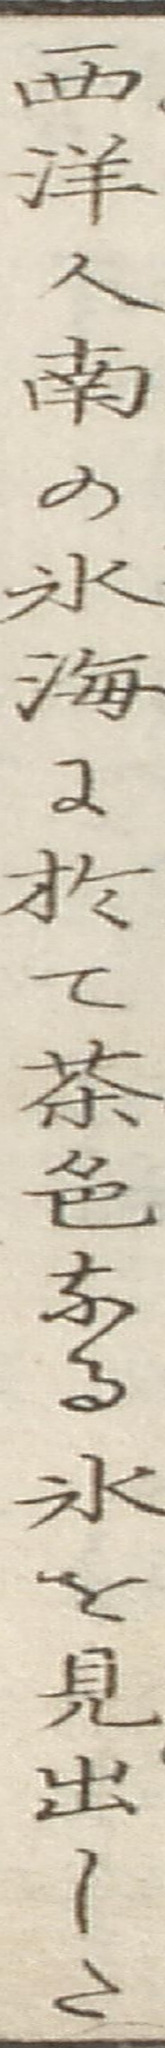西洋人南の氷海に於て、茶色なる氷を見出した
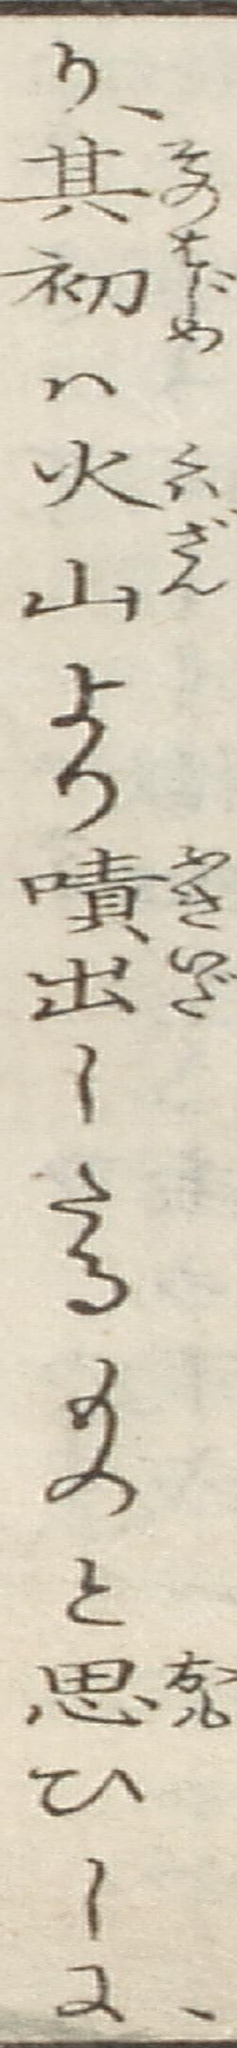り、其初は火山より噴出したるものと思いしに、
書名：変異辯　一名、天變地異拾遺　全
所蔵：東京大学地震研究所図書室 Earthquake Research Institute Library, The University of Tokyo, JAPAN
